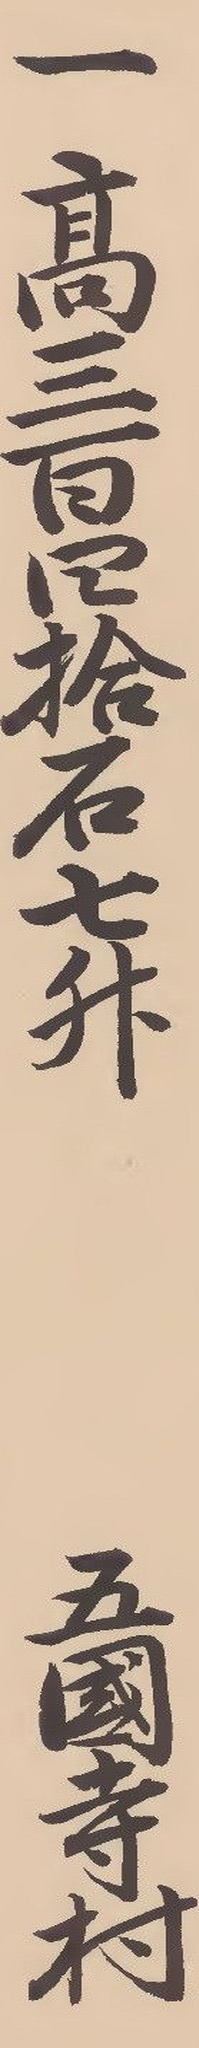一高三百四拾石七升五国寺村
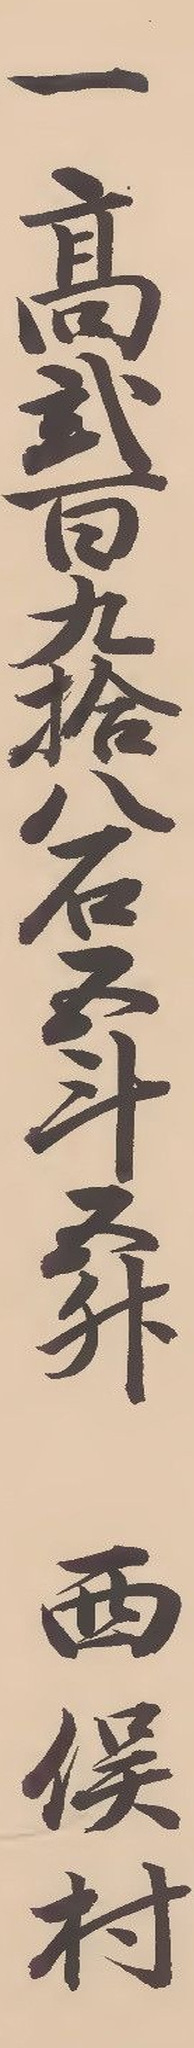一高弐百九拾八石五斗五升西俣村
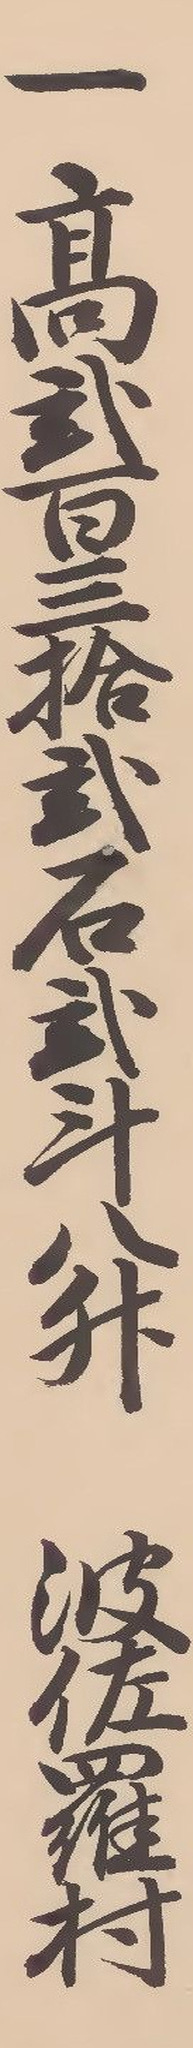一高弐百三拾弐石弐斗八升波佐羅村

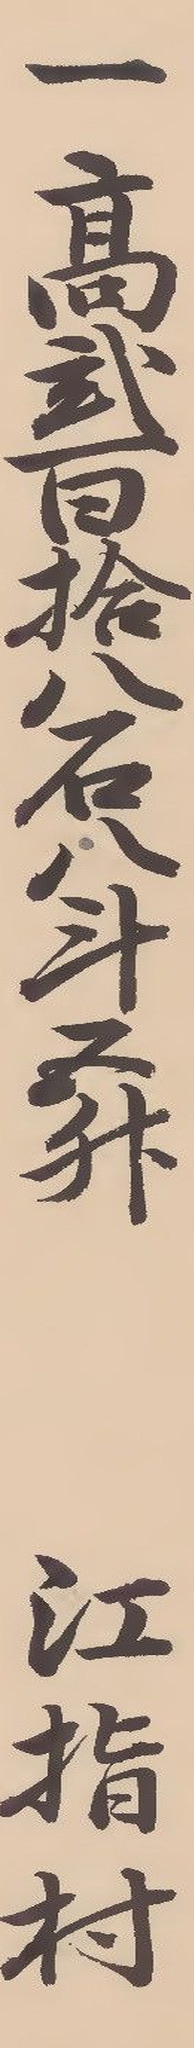一高弐百拾八石八斗五升江指村
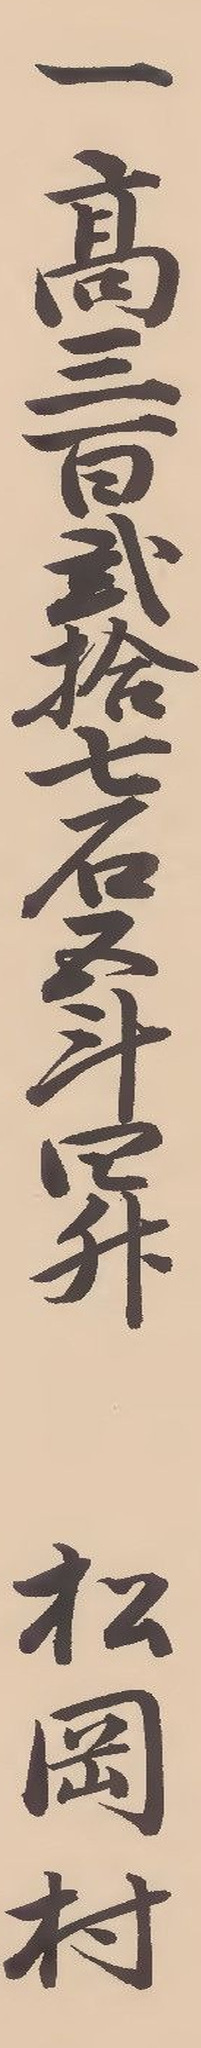一高三百弐拾七石五斗四升松岡村
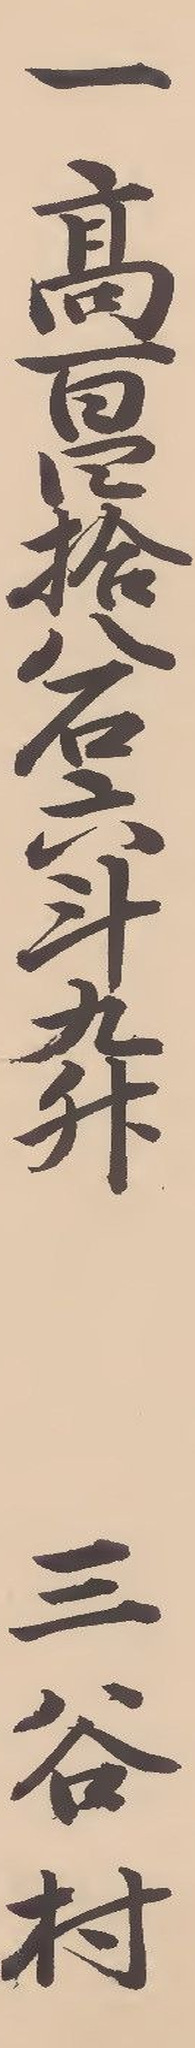一高百四拾八石六斗九升三谷村
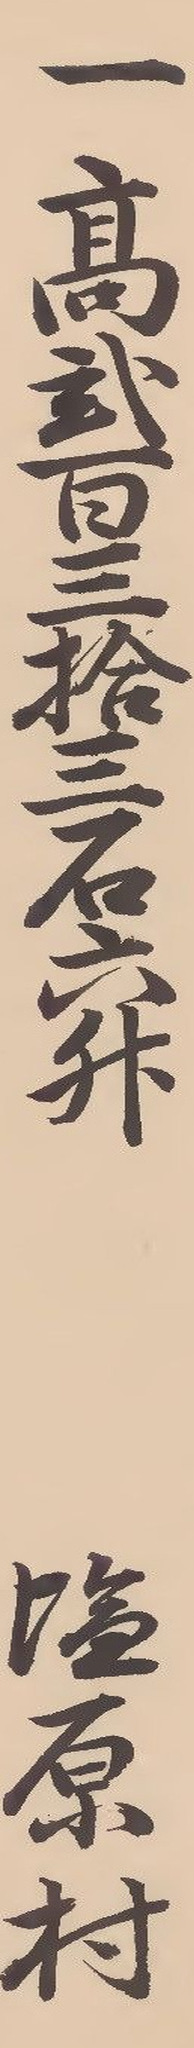一高弐百三拾三石六升塩原村
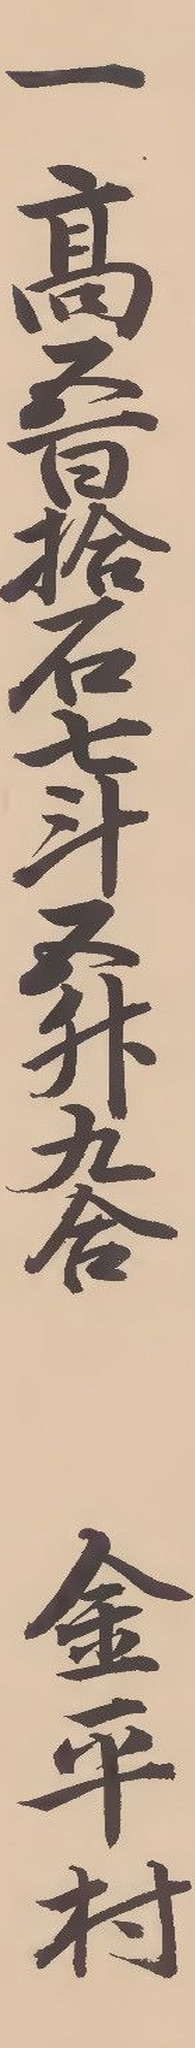一高五百拾石七斗五升九合金平村
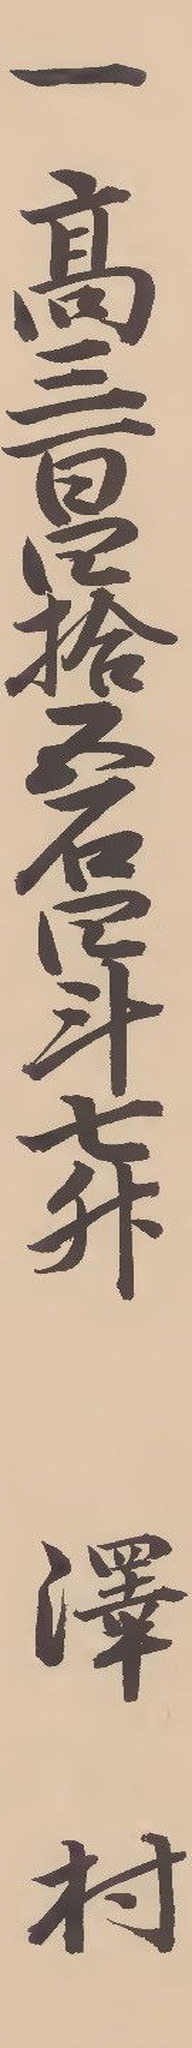一高三百四拾五石四斗七升沢村
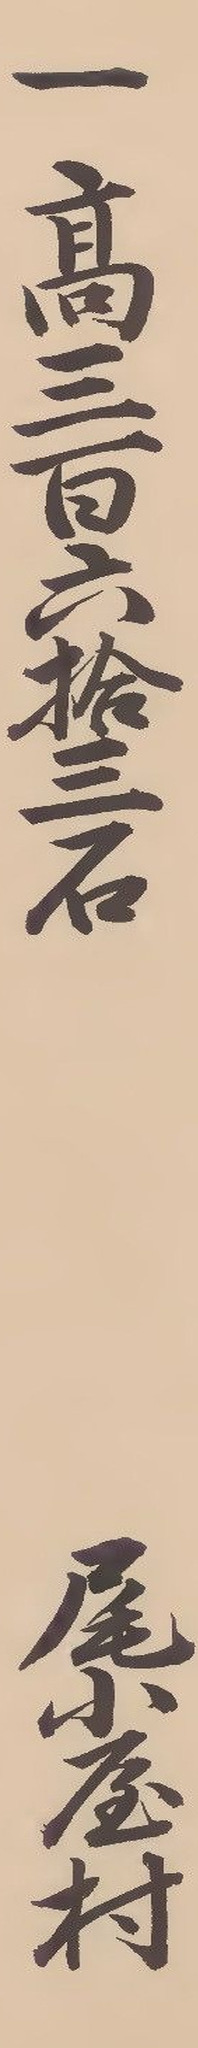一高三百六拾三石尾小屋村
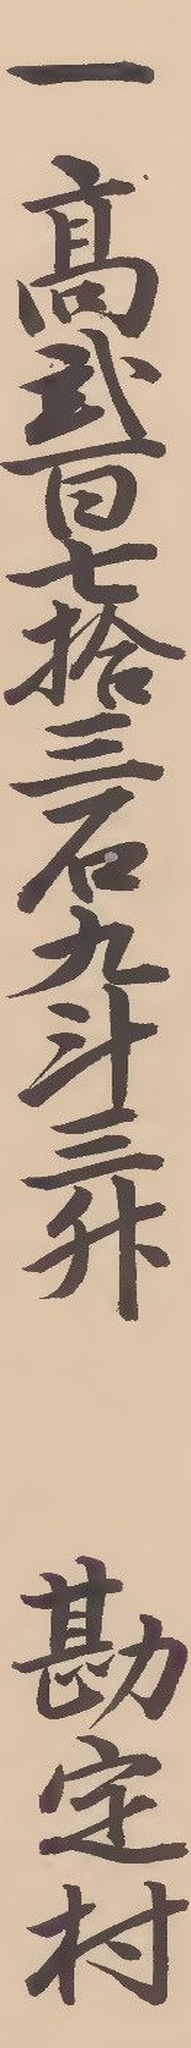一高弐百七拾三石九斗三升勘定村

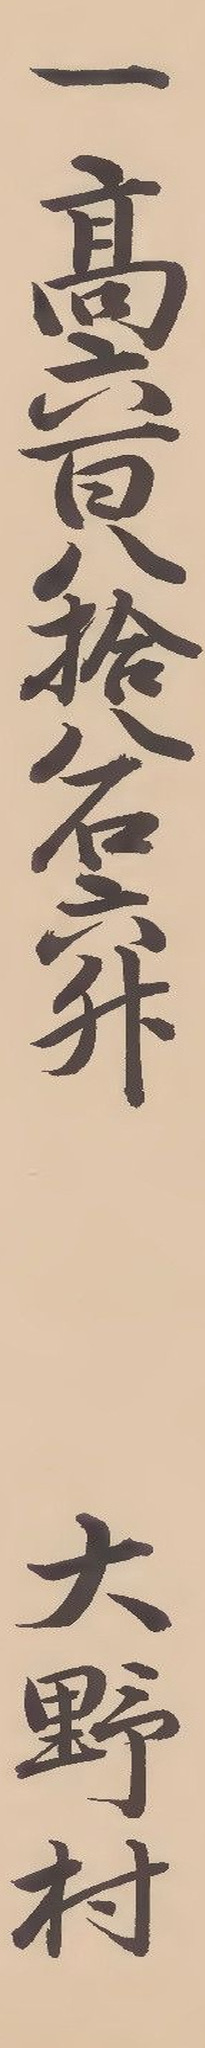一高六百八拾八石六升大野村
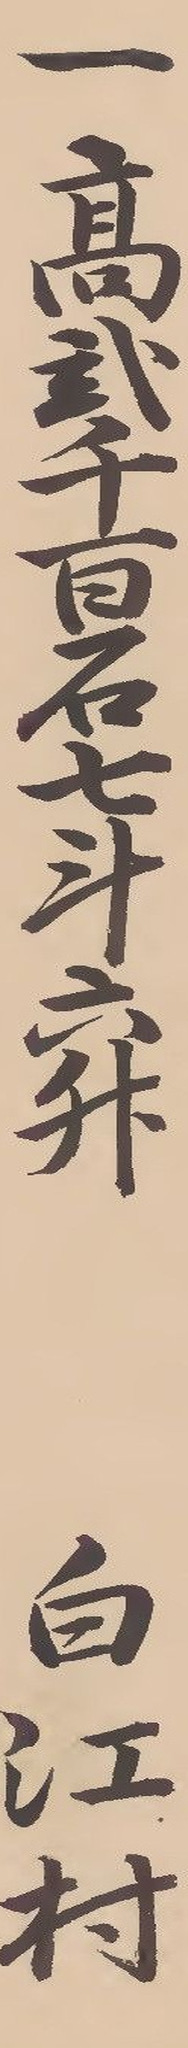一高弐千百石七斗六升白江村
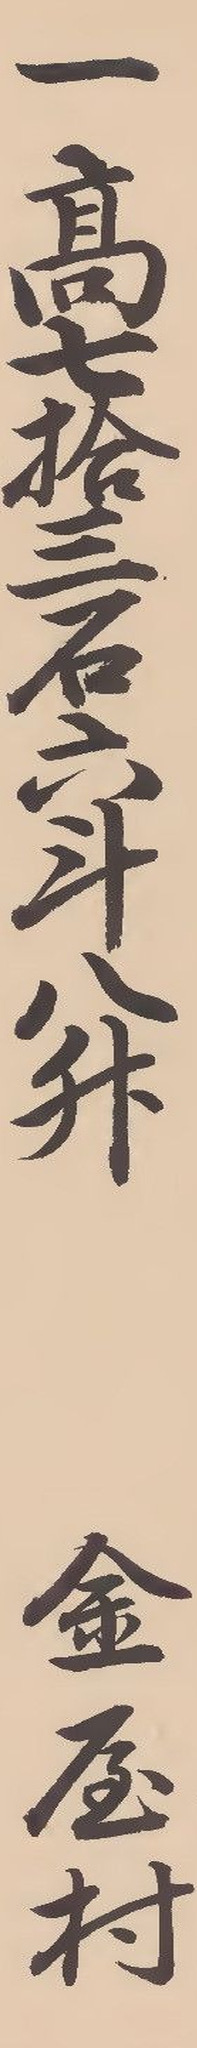一高七拾三石六斗八升金屋村
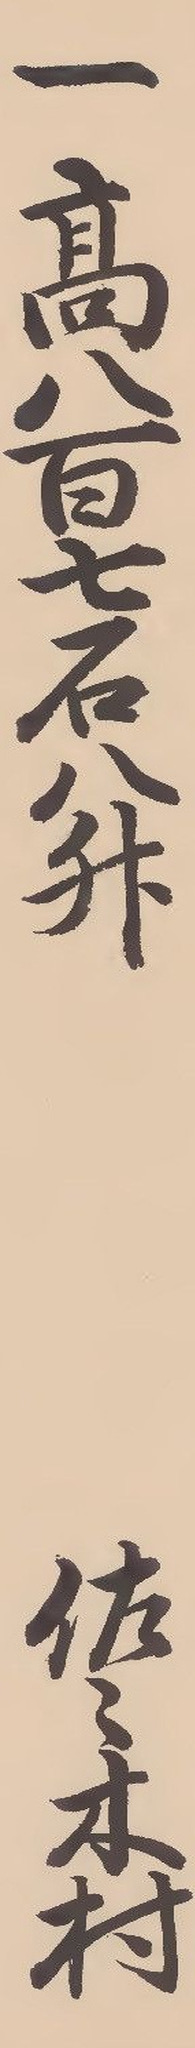一高八百七石八升佐々木村
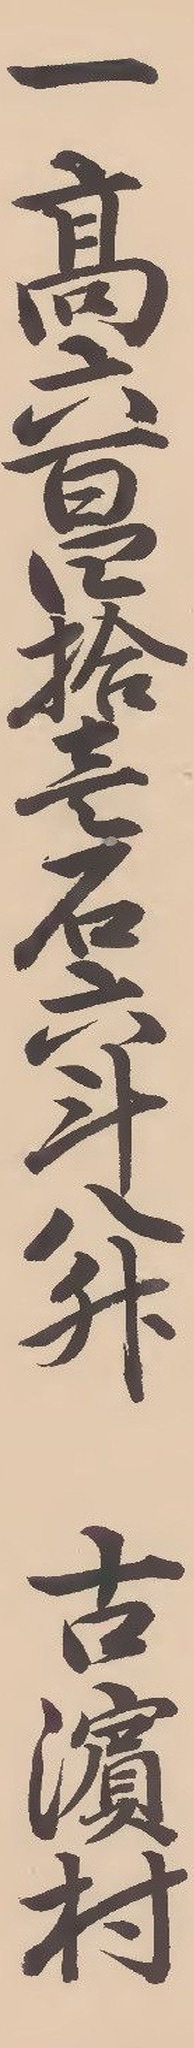一高六百四拾壱石六斗八升古浜村
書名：加賀国郷帳
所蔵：国立公文書館 National Archives of Japan
